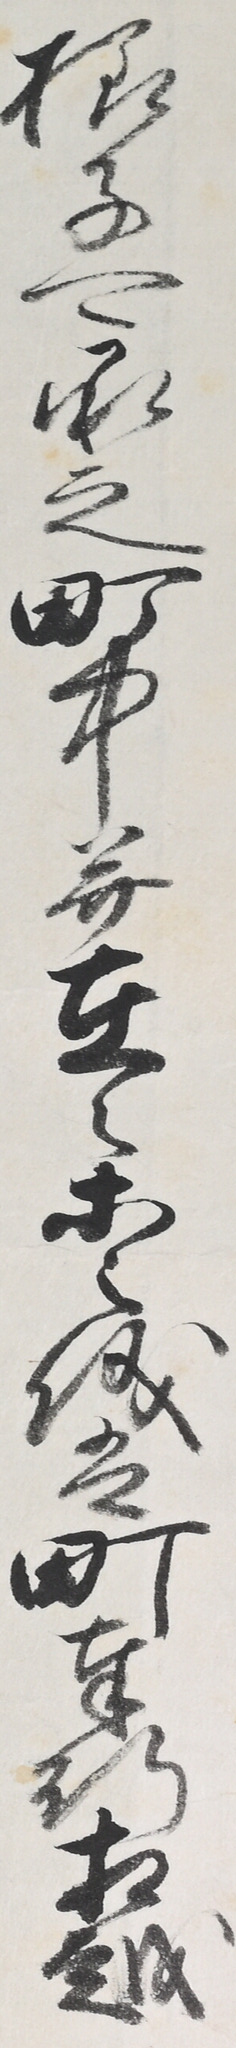様子可承之町中幷在々等之儀は町奉行相越
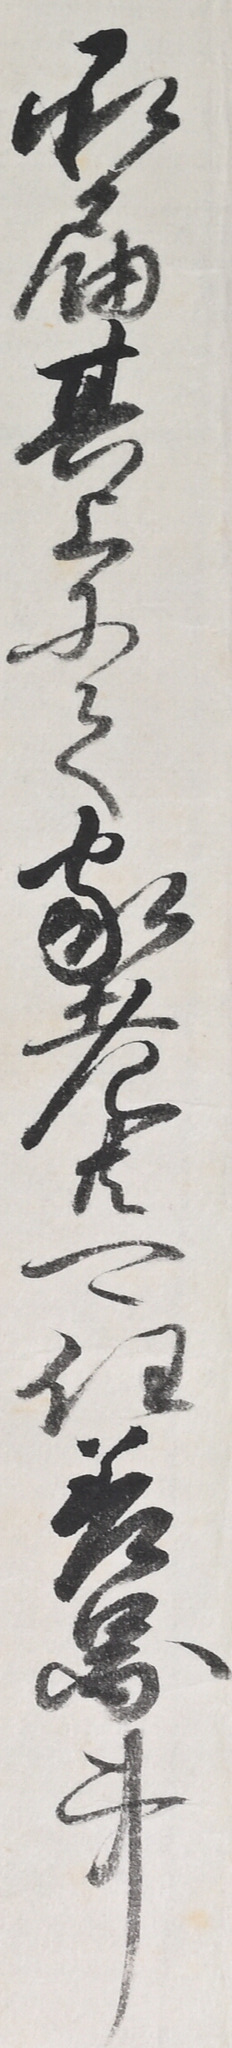承届其上にて家老共可任差図事
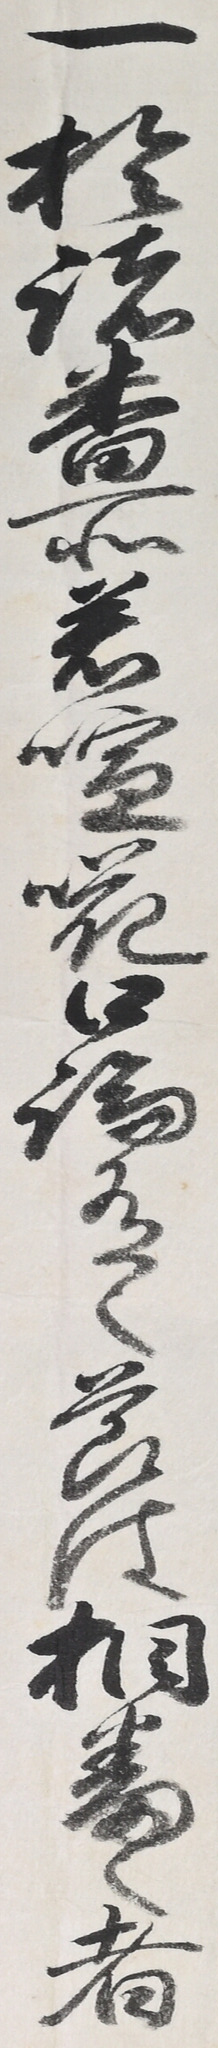一於諸番所若喧嘩口論有之節は相番之者
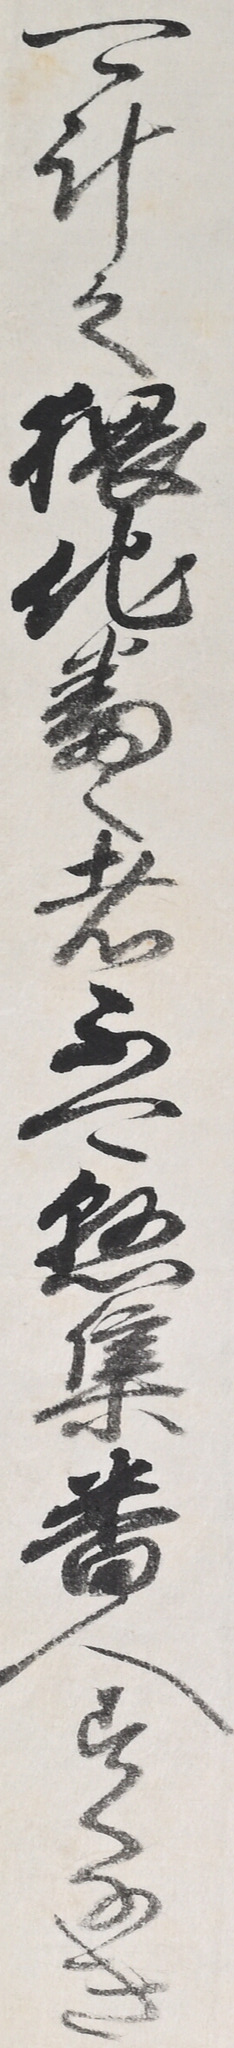可計之猥他番之者不可懸集番人すくなき
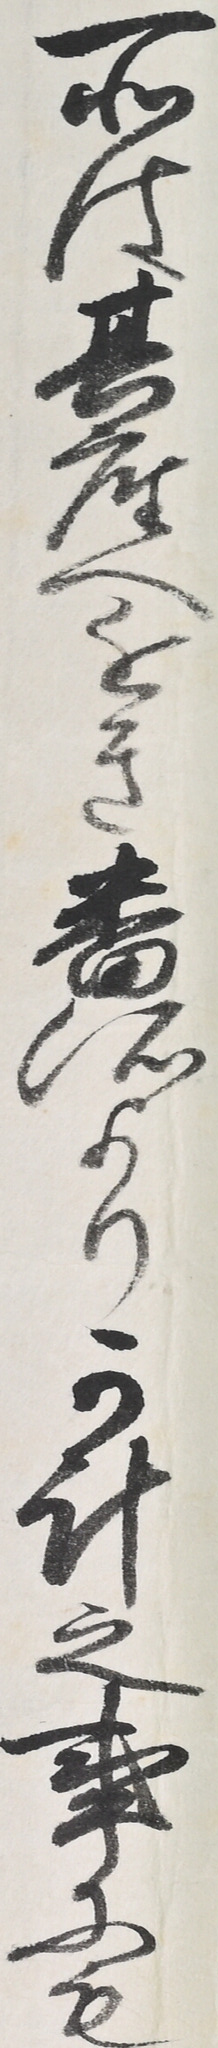所は其座へ近き番所より可計之事にも
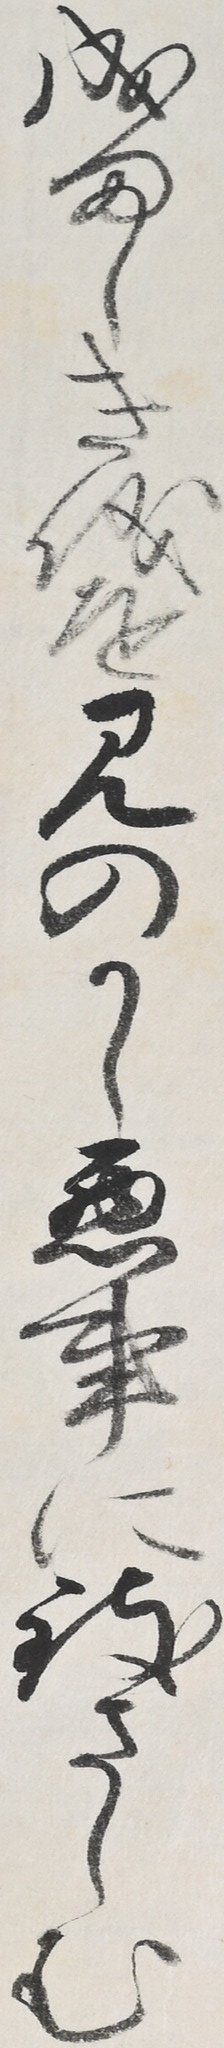成ましき儀を見逃のかし悪事に致さしむ
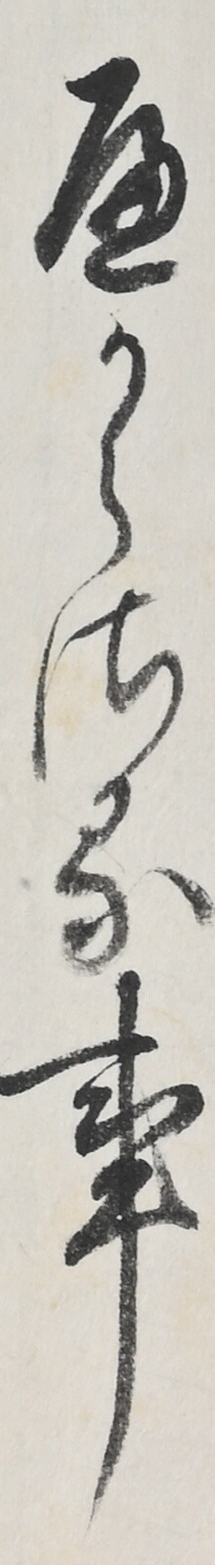へからさる事
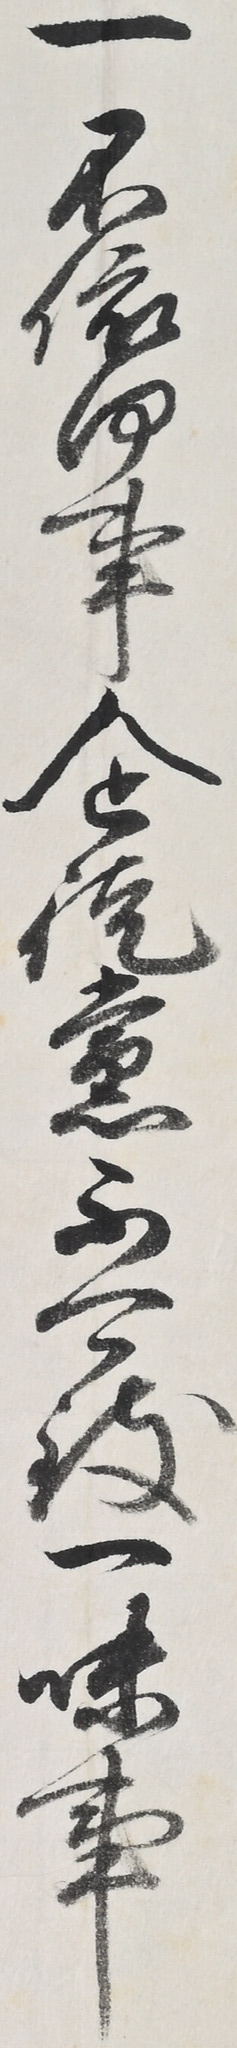一不依何事企徒黨不可致一味事
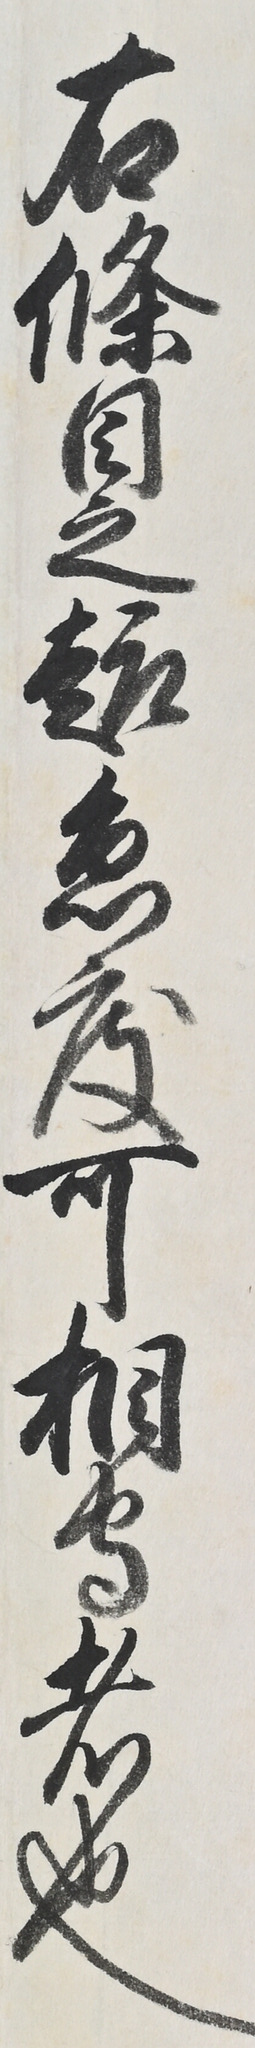右條目之趣急度可相守者也
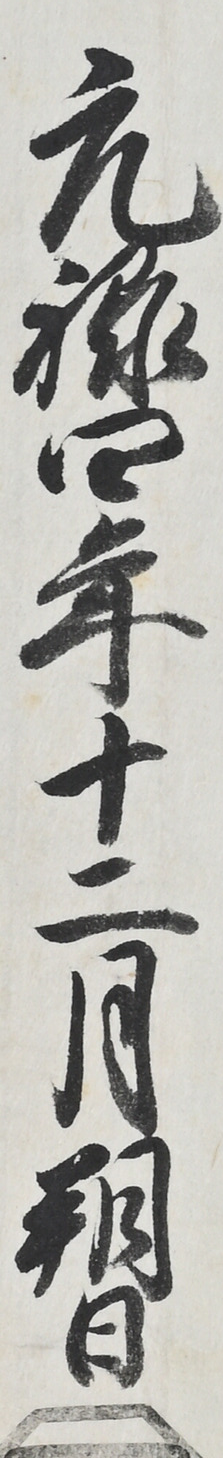元禄四年十二月朔日
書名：御条目
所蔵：伊那市立高遠町図書館・合同会社AMANE
